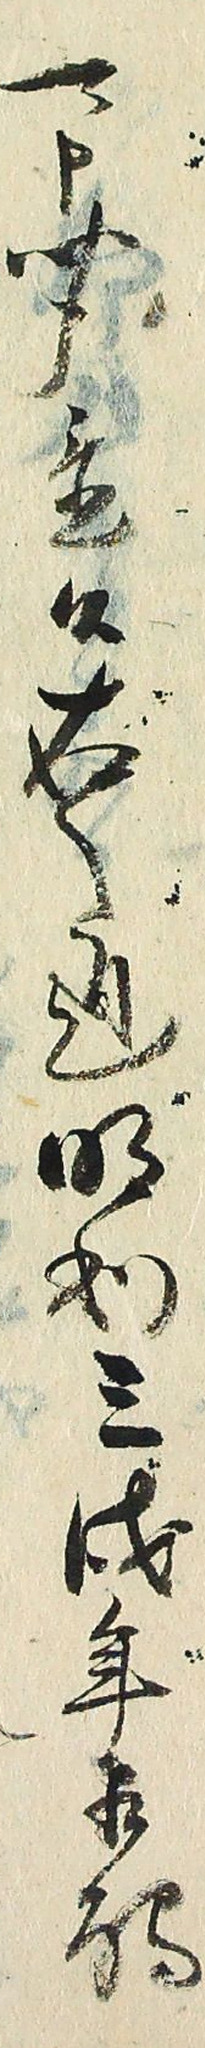可申聞置候右之通明和三戌年相触
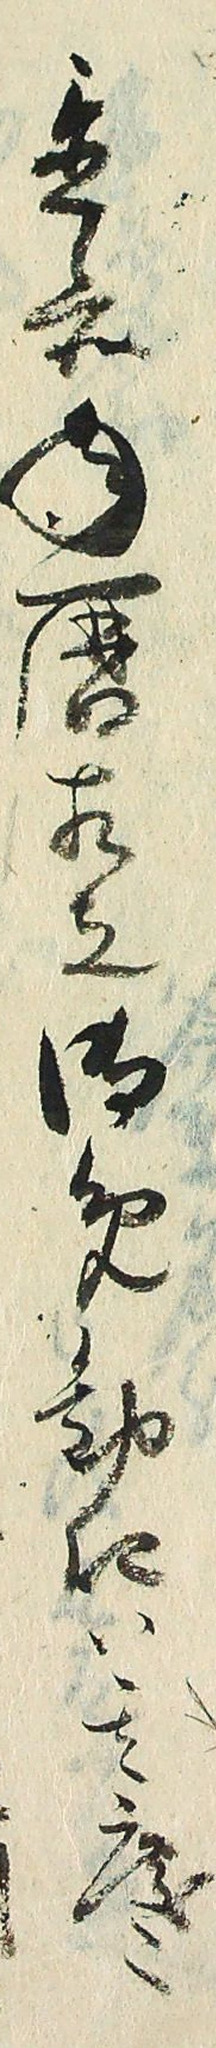置候所年暦相立御免勧化は其度に
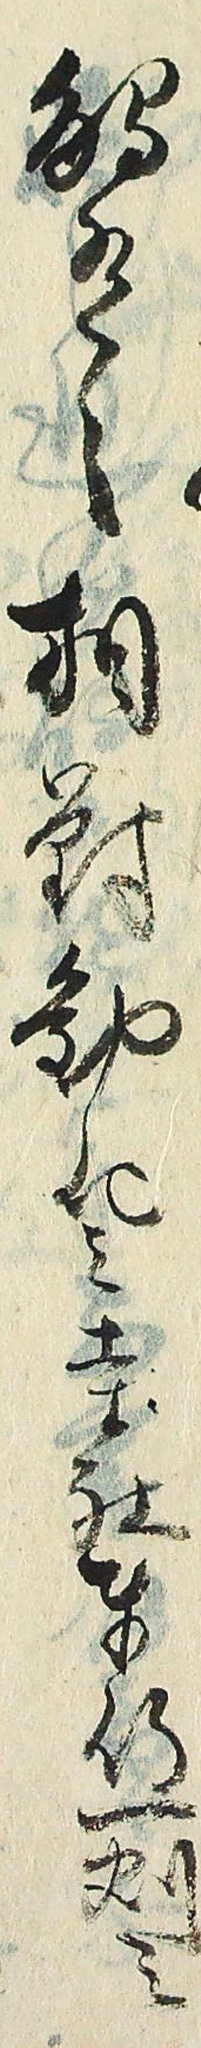触有之相対勧化は寺社奉行一判之
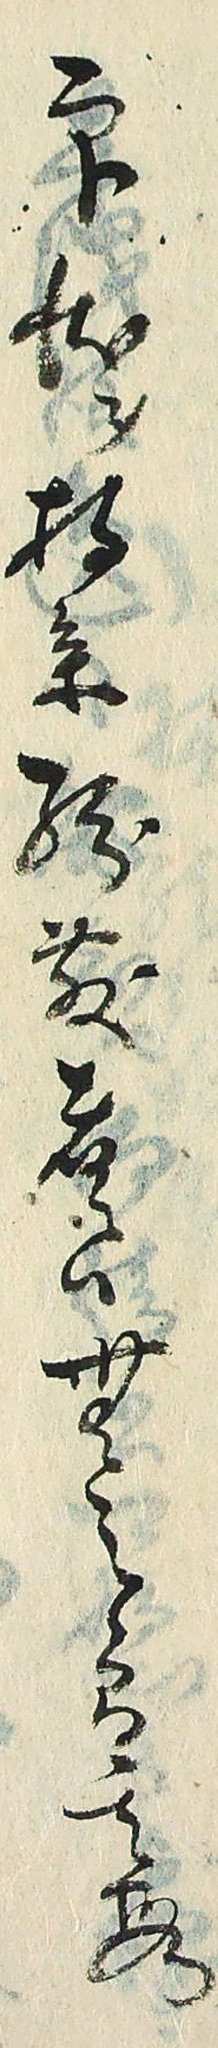印状を持参紛敷者には無之候間其段
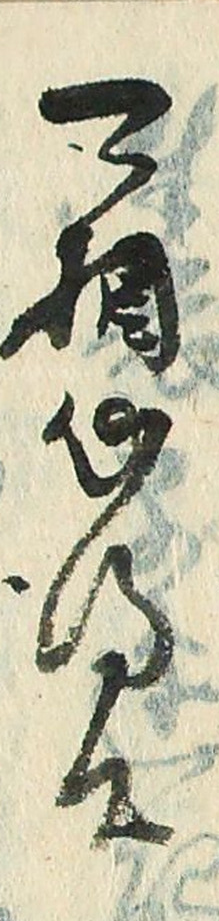可相心得候
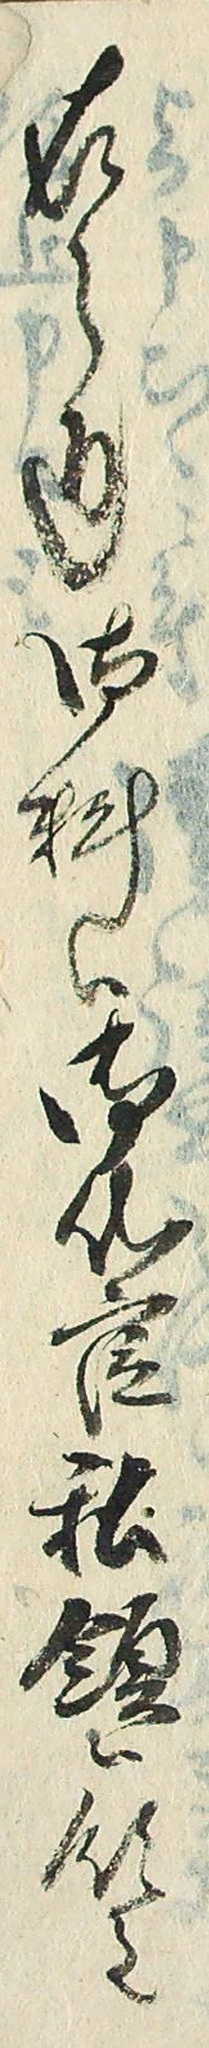右之通御料は御代官私領は領主

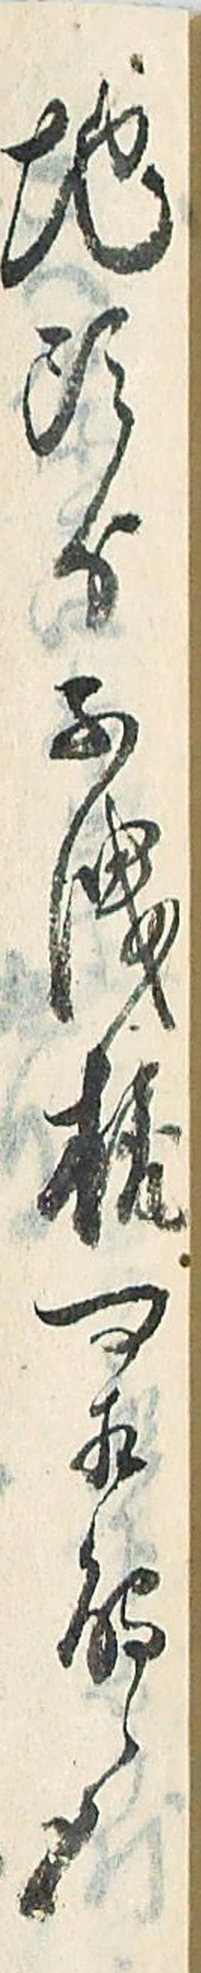地頭ゟ不洩様可相触候以上
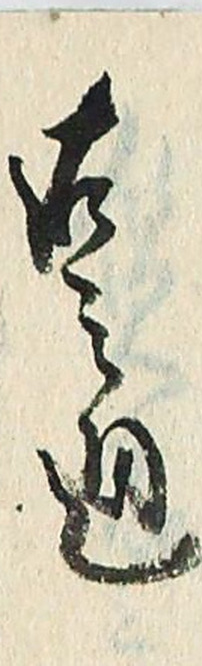右之通
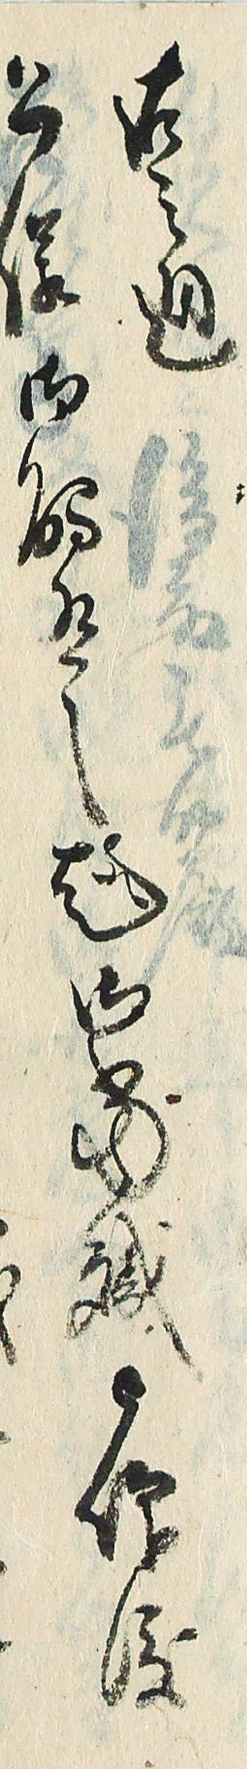公儀御触有之趣御当職被仰渡
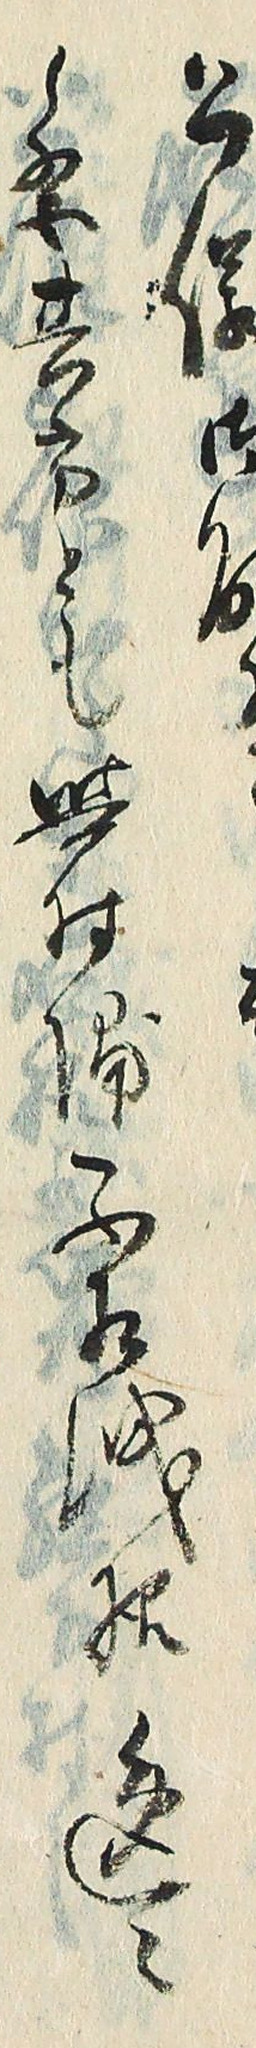候条其方とも与村浦不洩様逸々
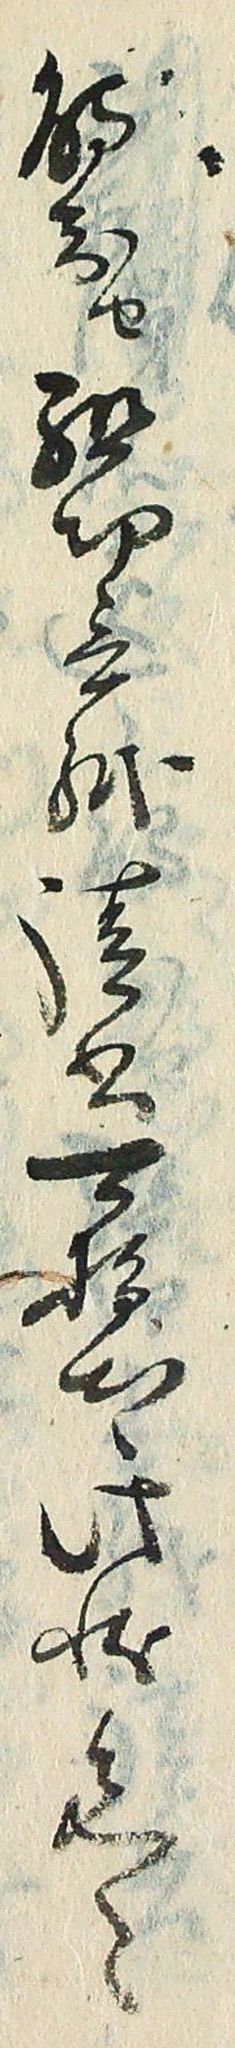触知せ組切壱紙請書可指出候此状先々
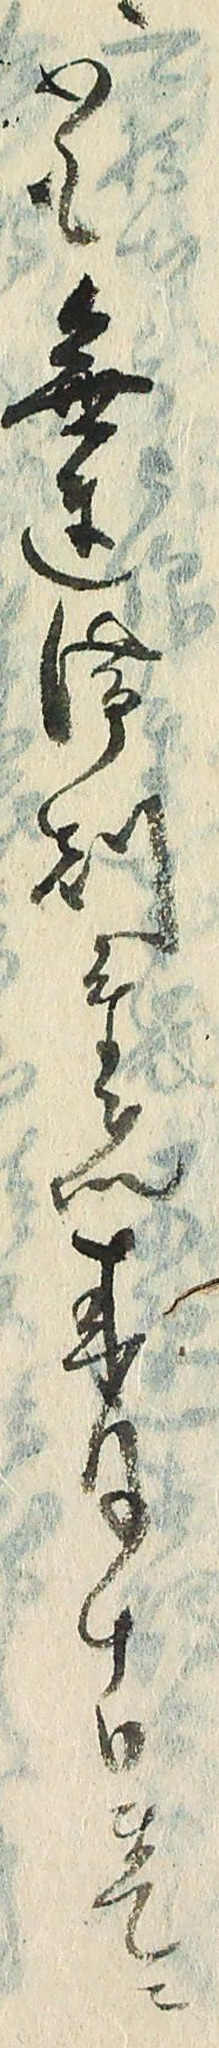少も無遅滞刻付を以来月十日まてに
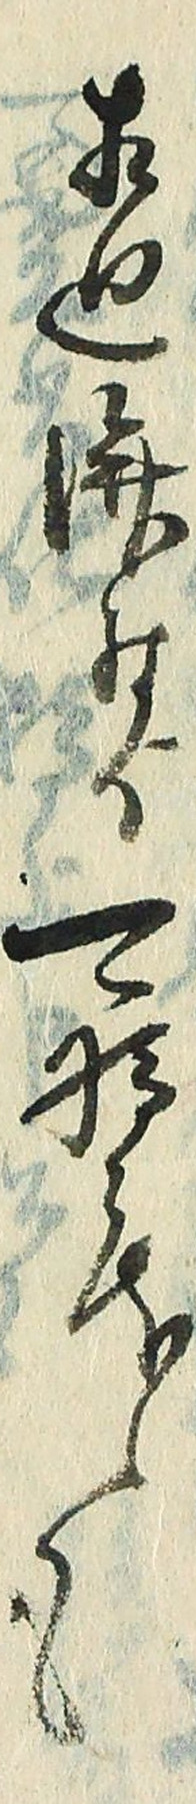相廻済村ゟ可指戻候以上
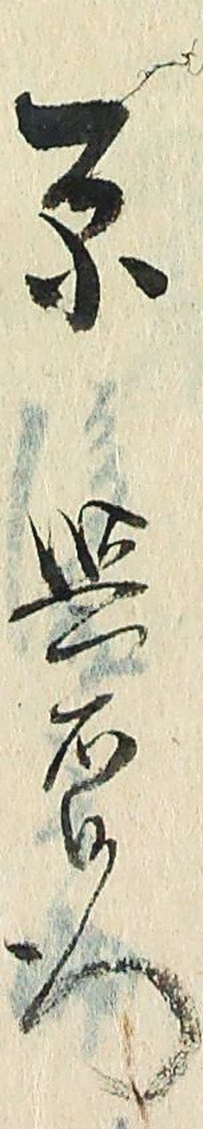原与右衛門
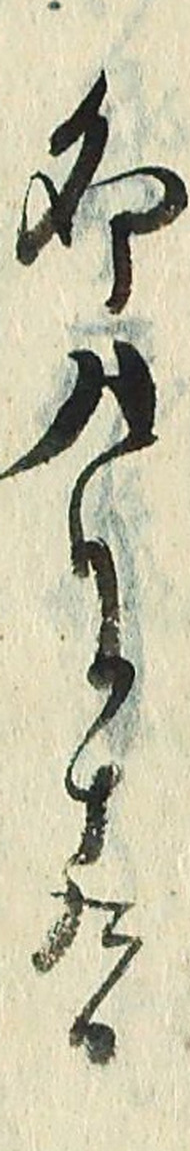卯八月十九日
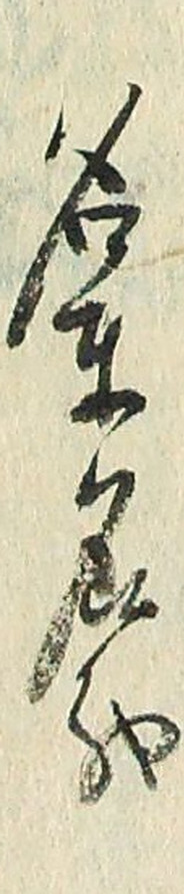名東名西
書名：諸御用御□受書控
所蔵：鳴門教育大学 Naruto University of Education
